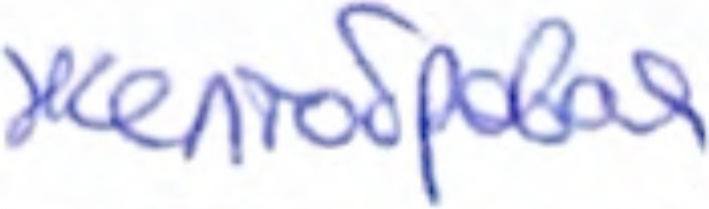желтобровая
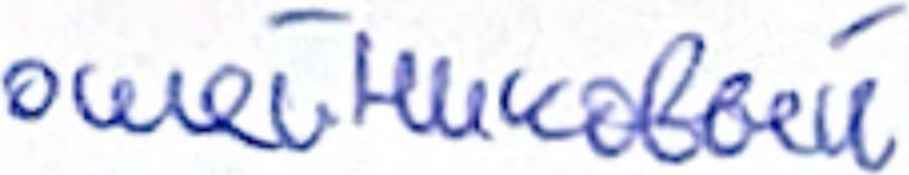ошейниковый
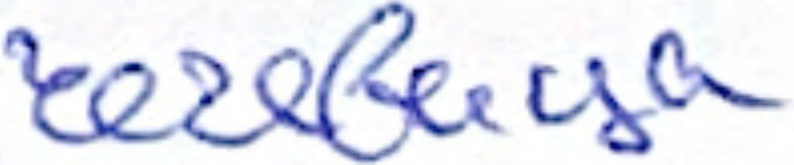чечевица
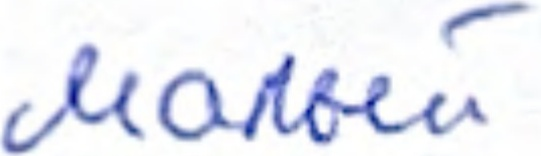малый
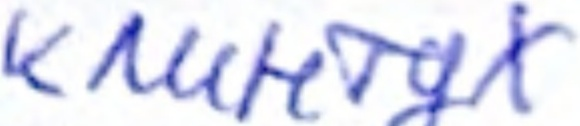клинтух
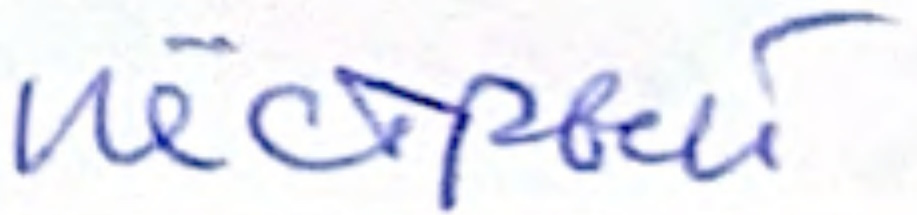пёстрый
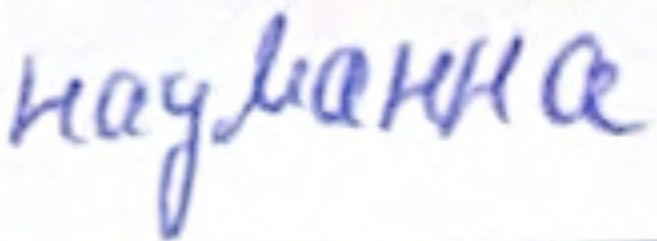науманна
